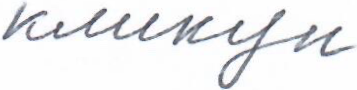кликун
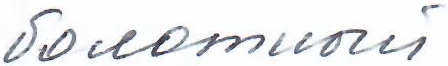болотный
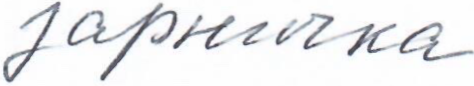зарничка
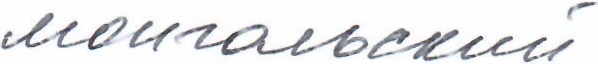монгольский
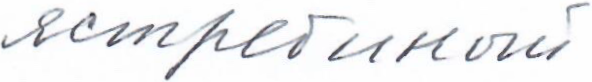ястребиный
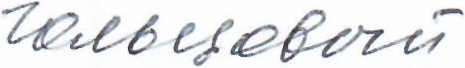гольцовый
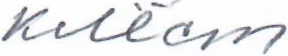клёст
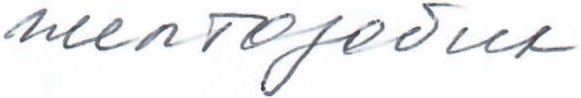желтозобик
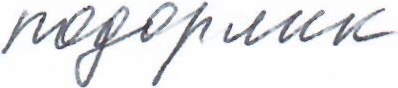подорлик
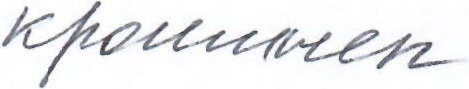кроншнеп
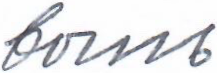выпь
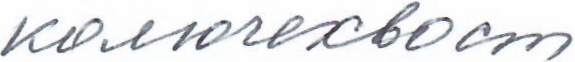колючехвост
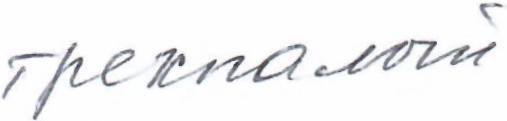трехпалый
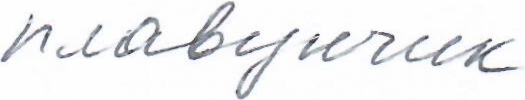плавунчик
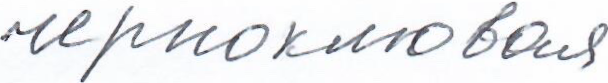черноклювая
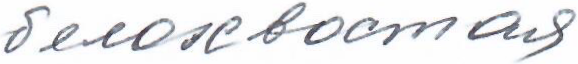белохвостая
